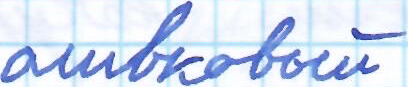оливковый
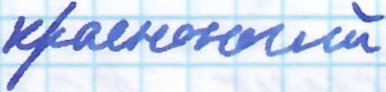красноногий
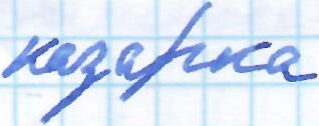казарка
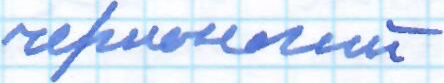черноногий
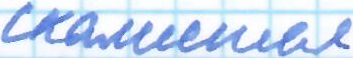скалистая
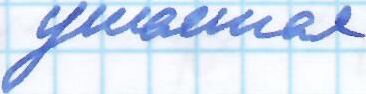ушастая
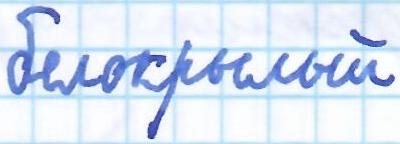белокрылый
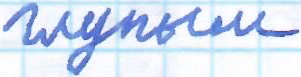глупыш
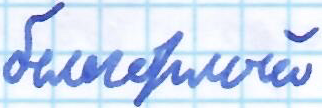белогорлый
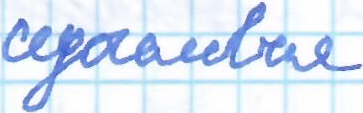седоголовая
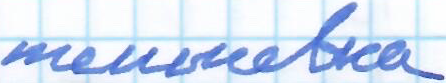теньковка
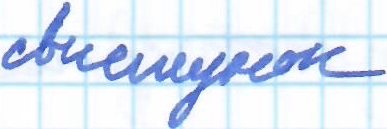свистунок
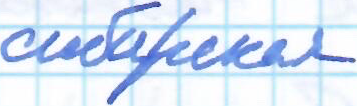сибирская
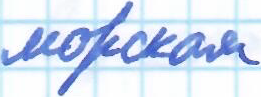морская
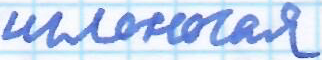иглоногая
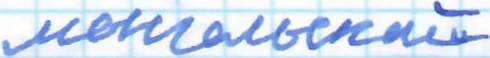монгольский
